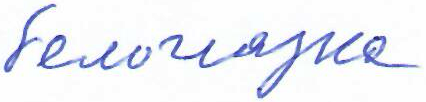белоглазка
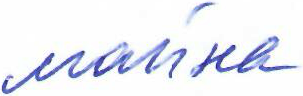майна
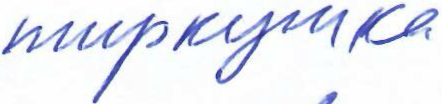тиркушка
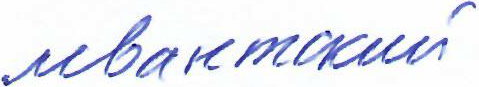левантский
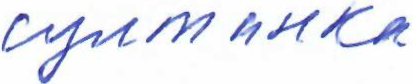султанка
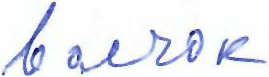волчок
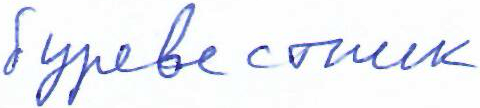буревестник
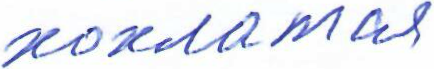хохлатая
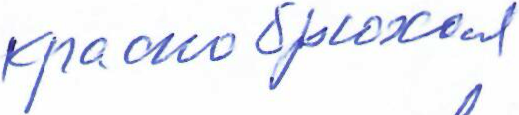краснобрюхая
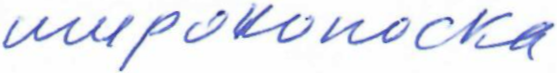широконоска
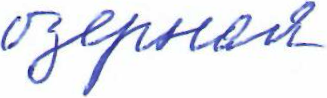озерная
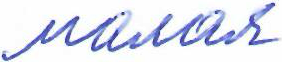малая
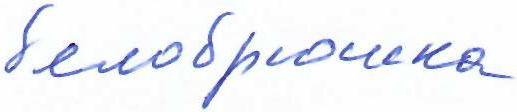белобрюшка
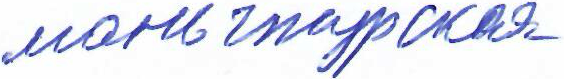маньчжурская
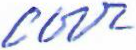сыч
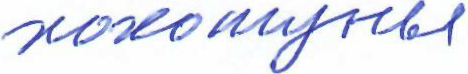хохотунья
